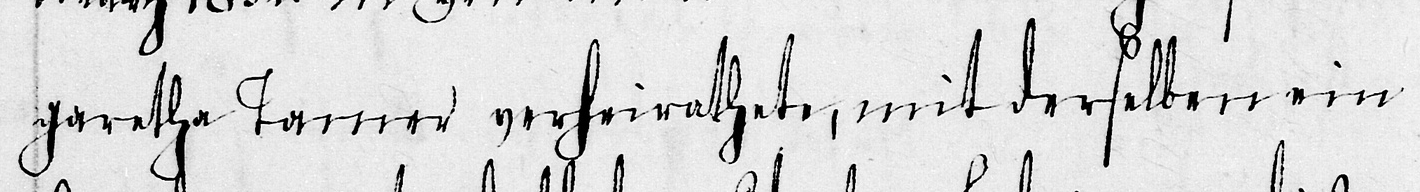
garetha Tanner verheirathete, mit derselben ein
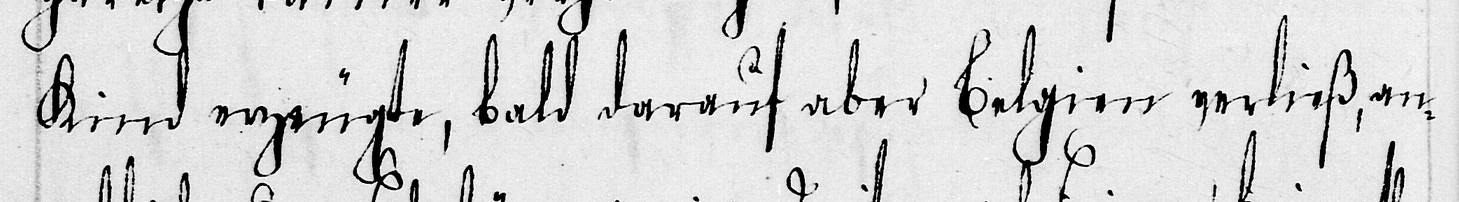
Kind erzeugte, bald darauf aber Belgien verließ, an¬
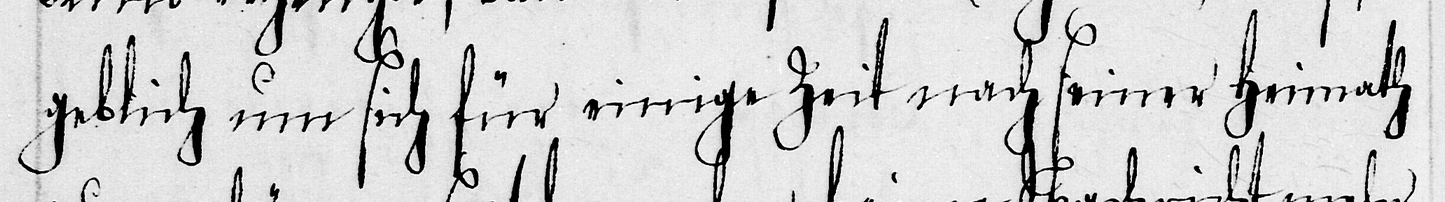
geblich um sich für einige Zeit nach seiner Heimath
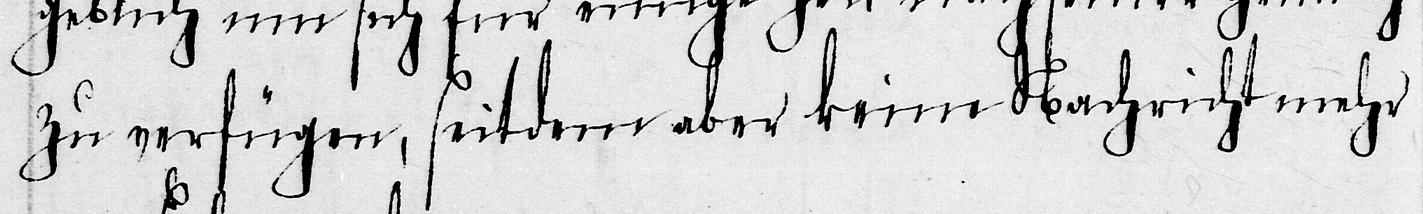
zu verfügen, seitdem aber keine Nachricht mehr
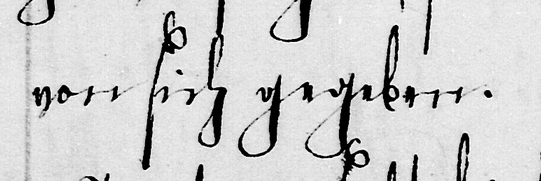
von sich gegeben.
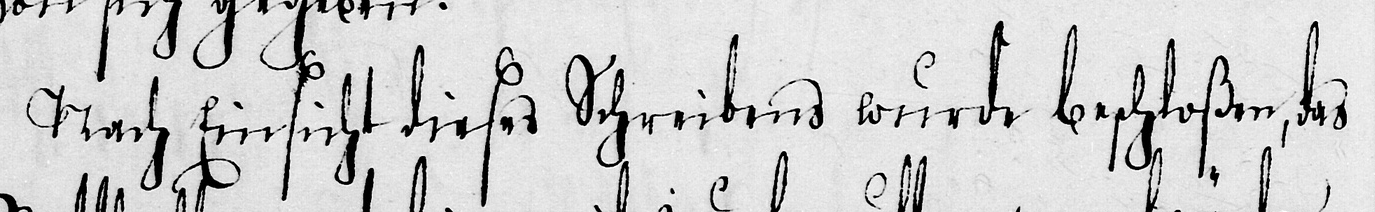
Nach Einsicht dieses Schreibens wurde beschloßen, das
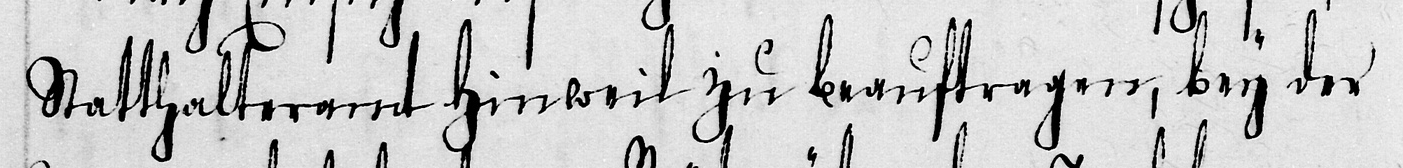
Statthalteramt Hinweil zu beauftragen, bey der
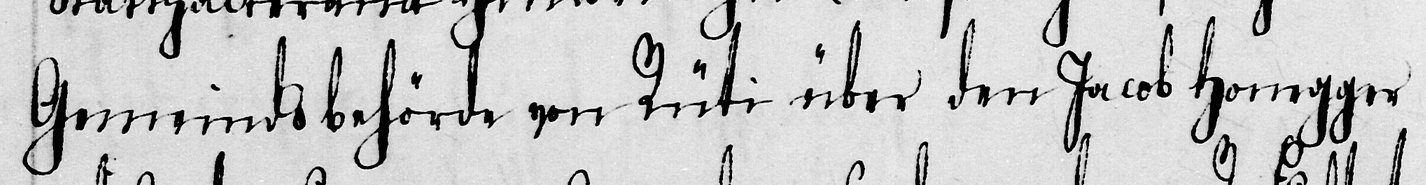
Gemeindsbehörde von Rüti über den Jacob Honegger
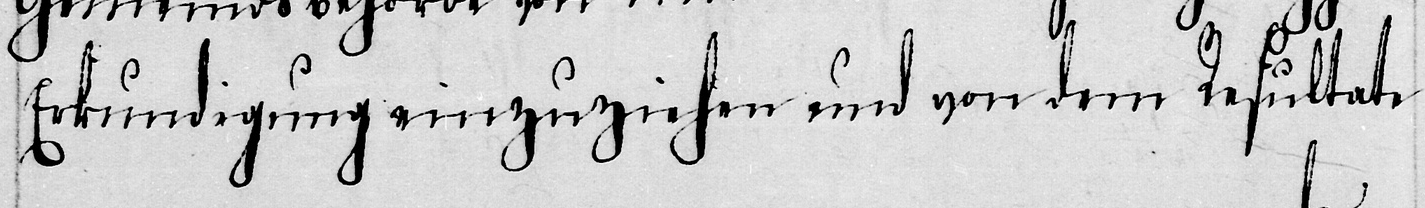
Erkundigung einzuziehen und von dem Resultate
